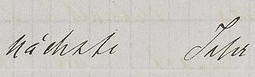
nächste Jahr
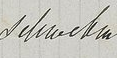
in der grössten
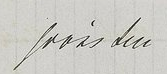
daher alles
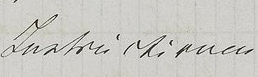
Instructionen
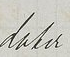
Roth u
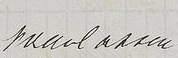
Pioda zu veranlassen
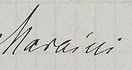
Maraini
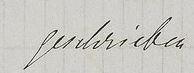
geschrieben
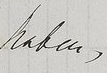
haben,
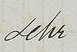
nicht
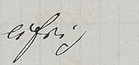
eifrig
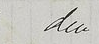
den
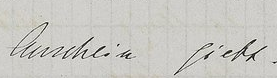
Anschein giebt.
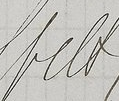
Welti
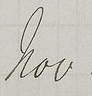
Bern
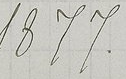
2. Nov.
